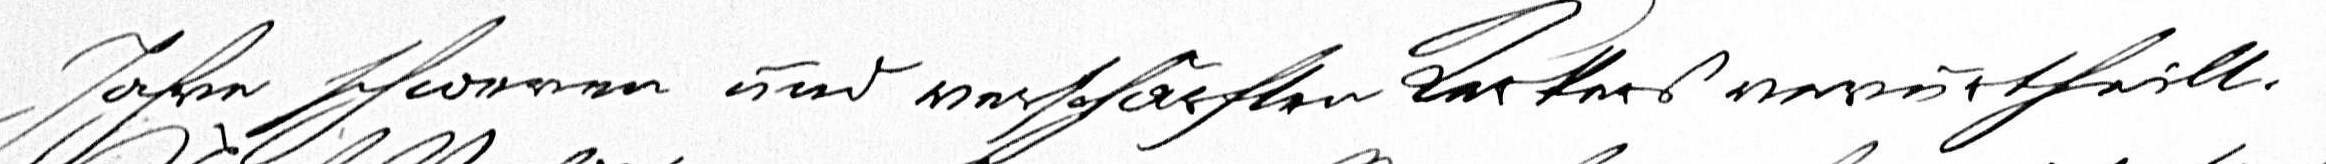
Jahre schweren und verschärften Kerkers verurtheilt.
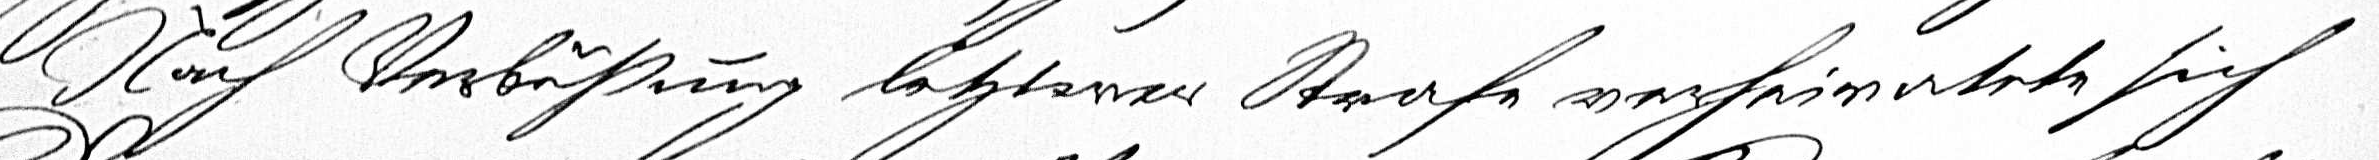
Nach Verbüßung letzterer Strafe verheiratete sich
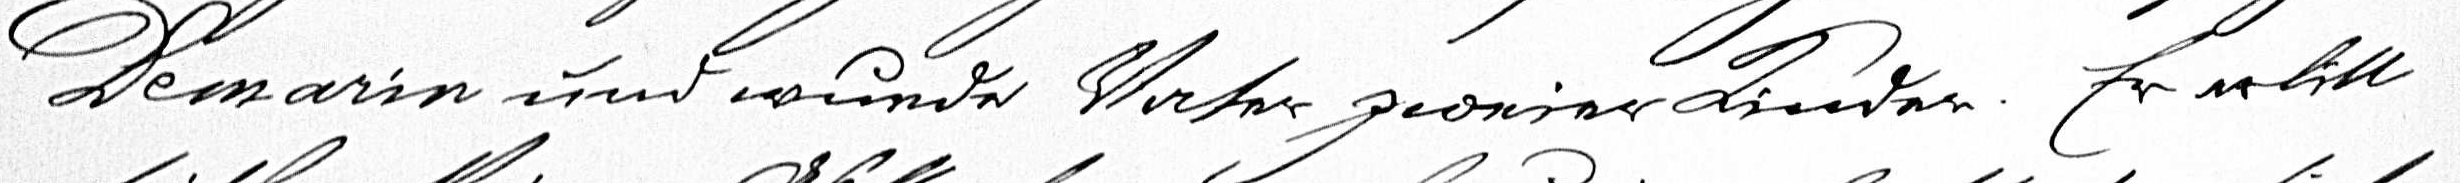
Demarin und wurde Vater zweier Kinder. Er erlitt
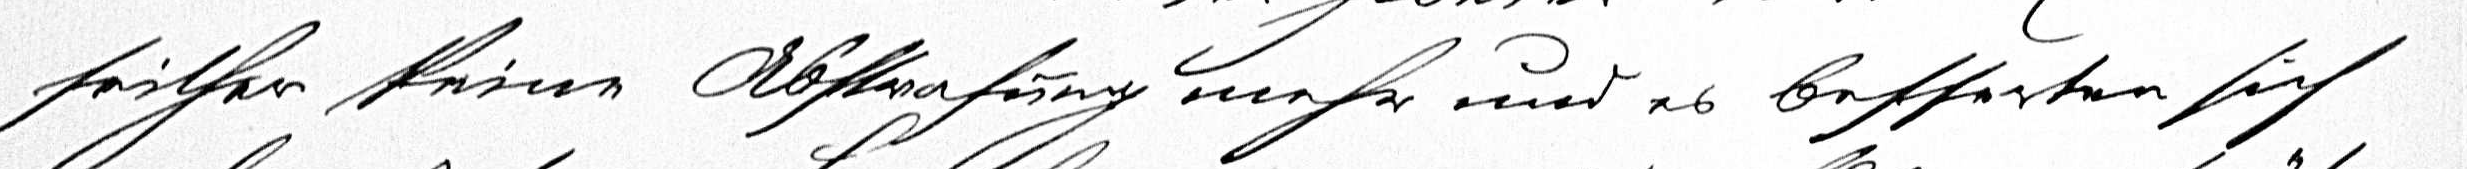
seither keine Abstrafung mehr und es besserten sich
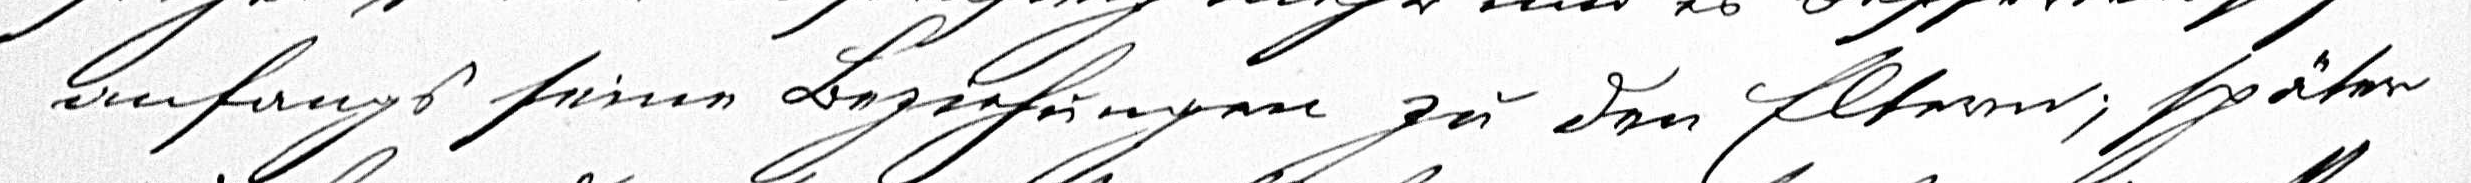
anfangs seine Beziehungen zu den Eltern; später
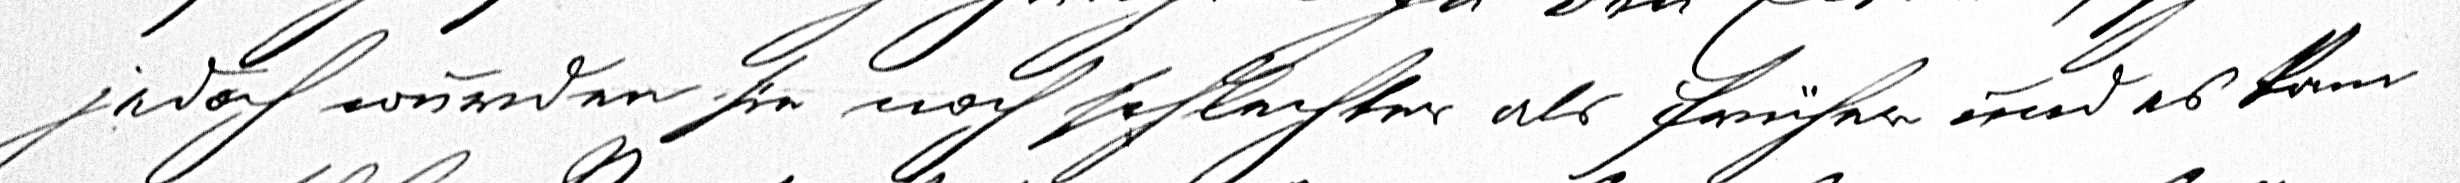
jedoch wurden sie nocht schlechter als früher und es kam
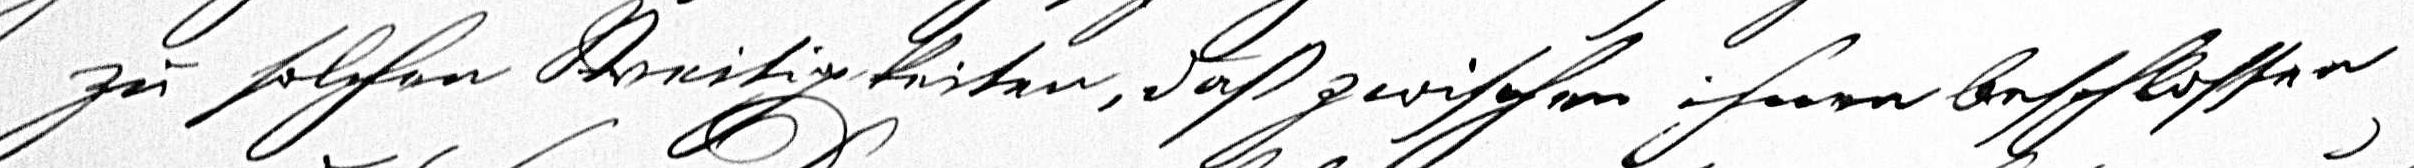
zu solchen Streitigkeiten, daß zwischen ihnen beschlossen
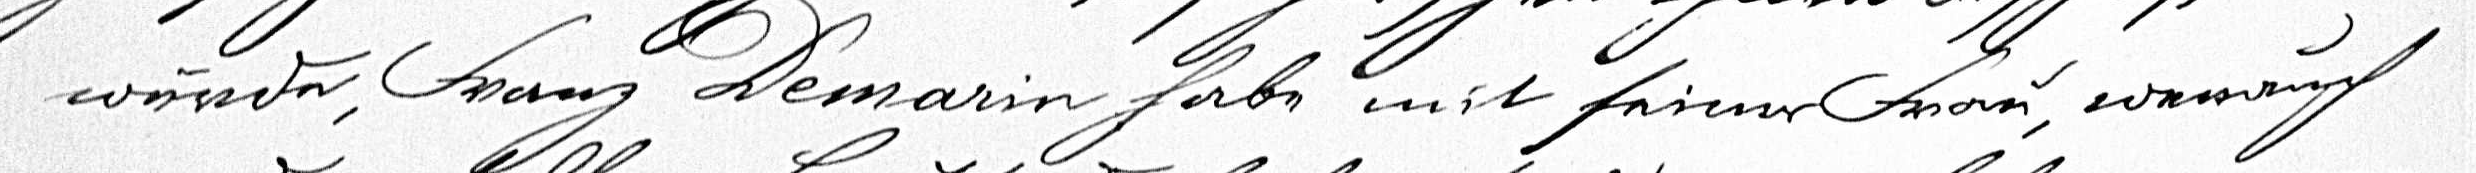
wurde, Franz Demarin habe mit seiner Frau, wenn auch
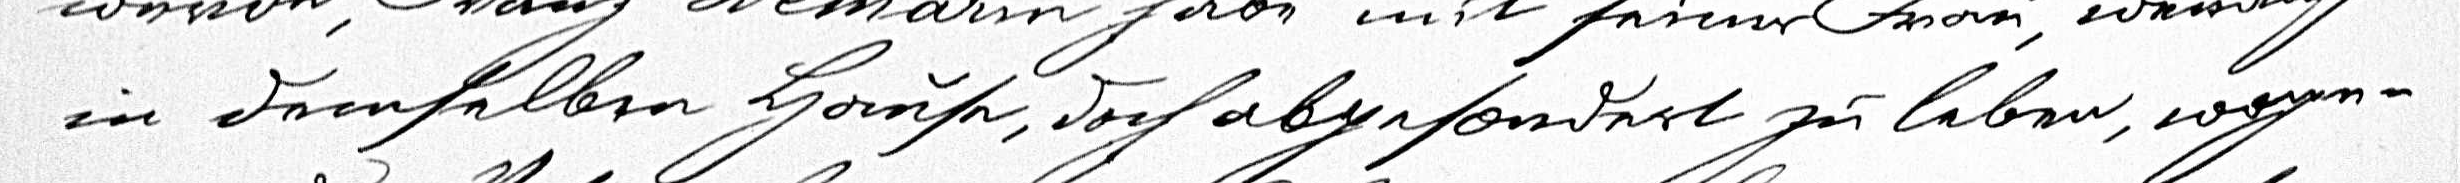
in emselben Hause, doch agbesondert zu leben woge¬
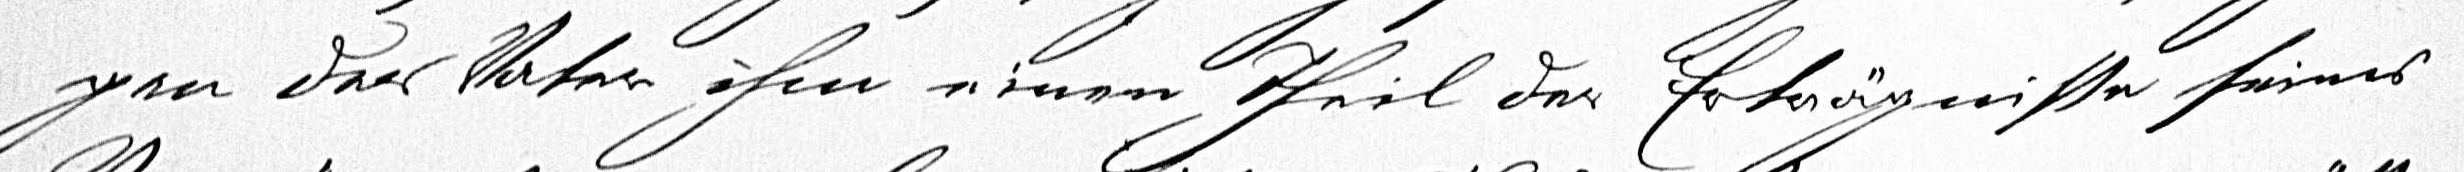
gen der Vater ihm einen Theil der Erträgnisse seines
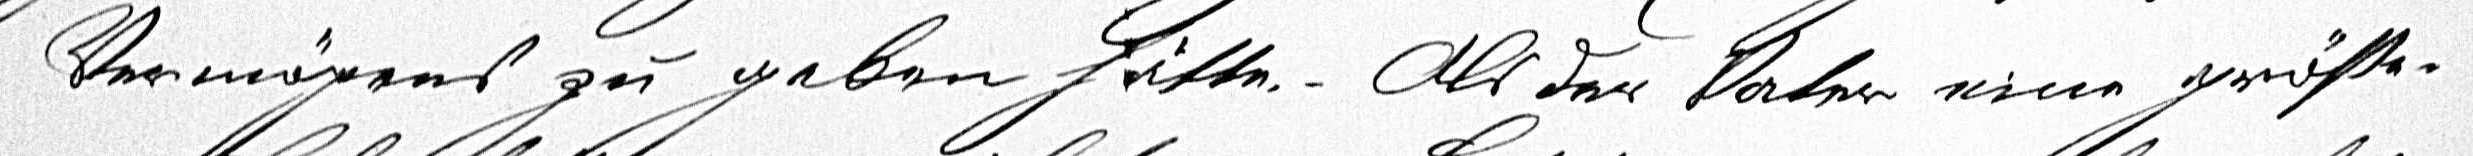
Vermögens zu geben hätte. Als der Vater eine größe¬
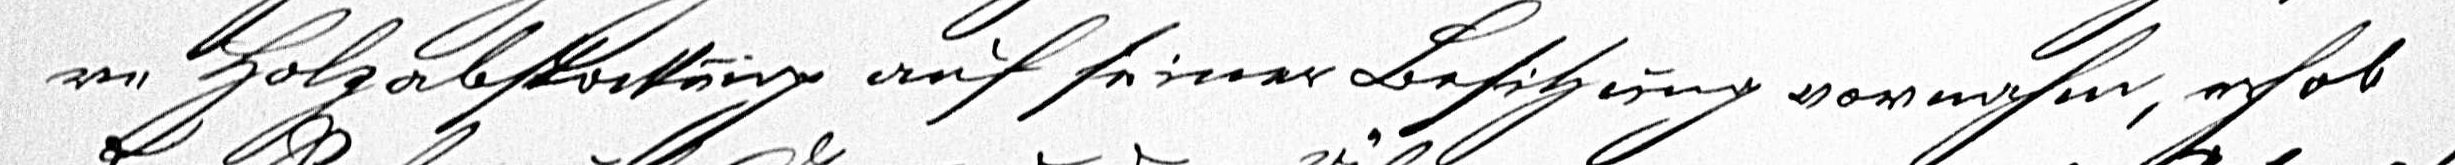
re Holzabstockung auf seiner Besitzung vornahm, erhob
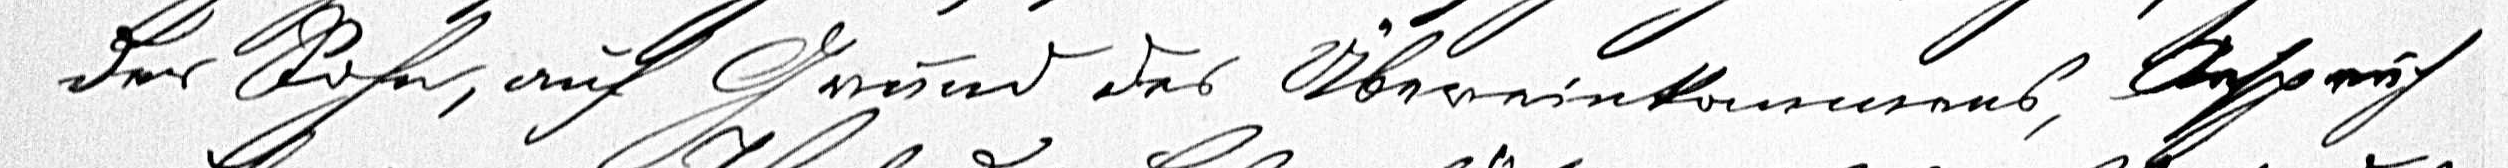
der Sohn, auf Grund des Übereinkommens, Anspruch
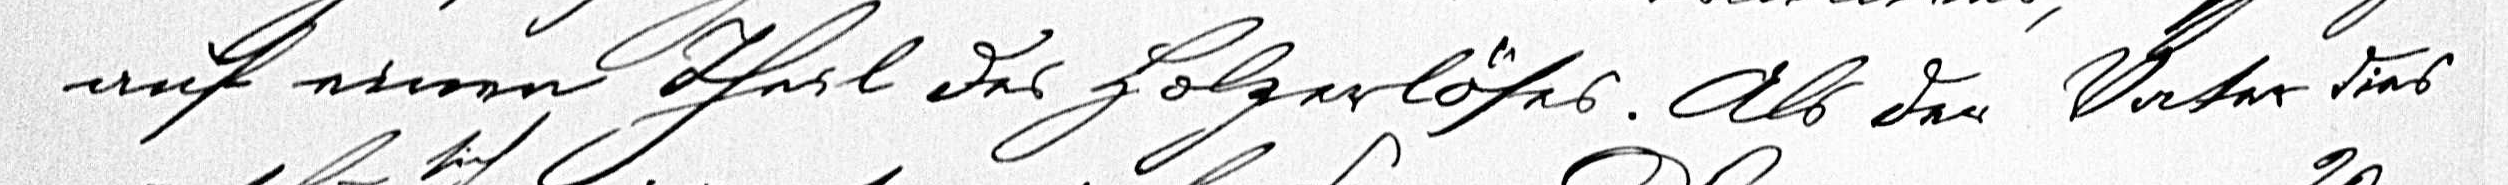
auf einen Theil des Holzerlöses. Als der Vater dies
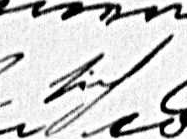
sich
